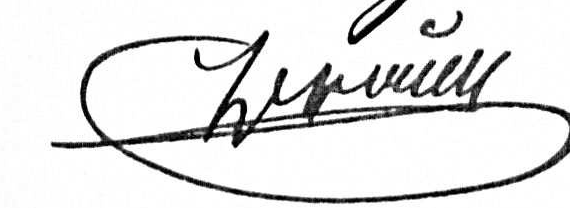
Wrany
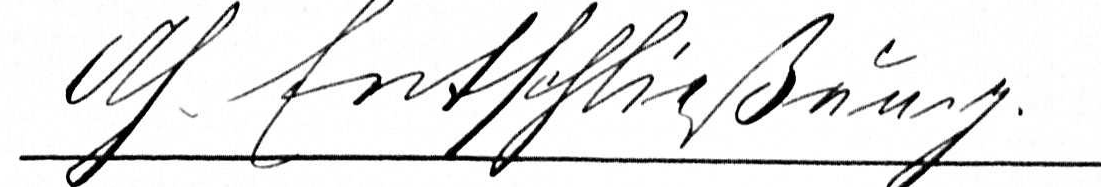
Ah Entschließung
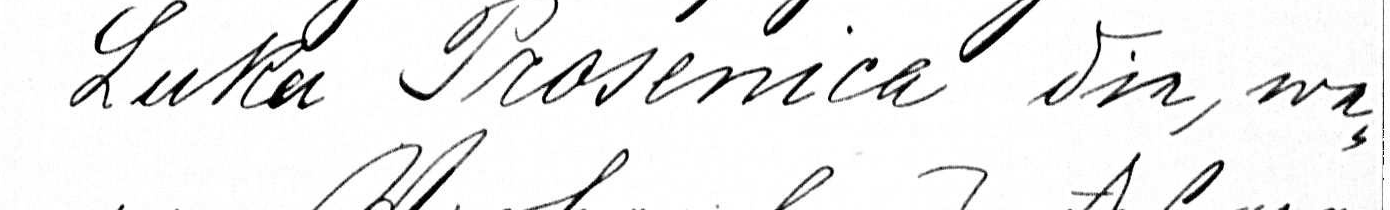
Luka Prosenica die, we¬
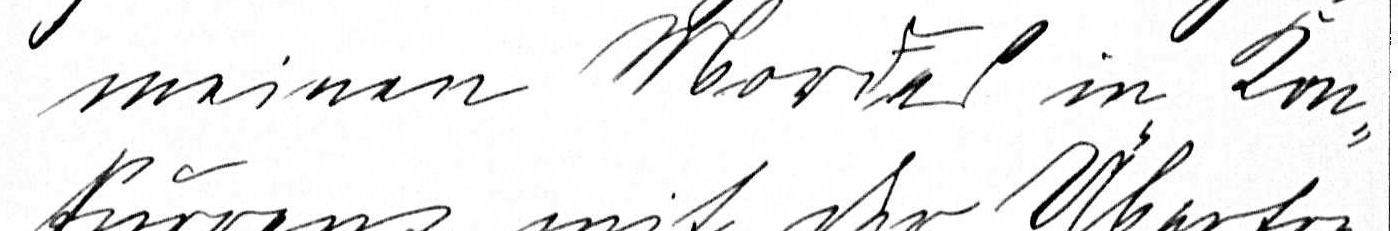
meinen Mordes in Kon¬
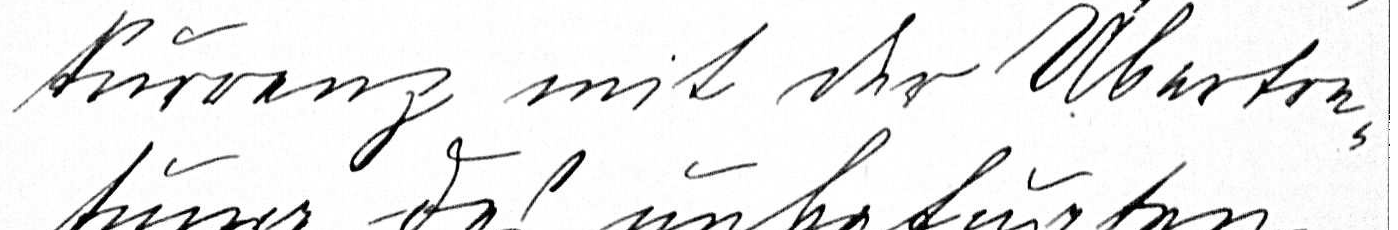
kurrenz mit der Übertre¬
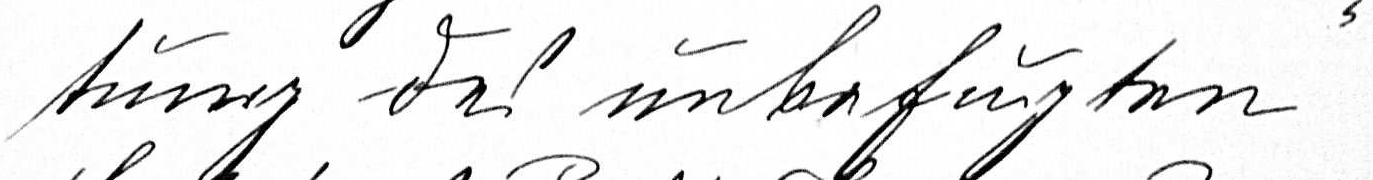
tung des unbefugten
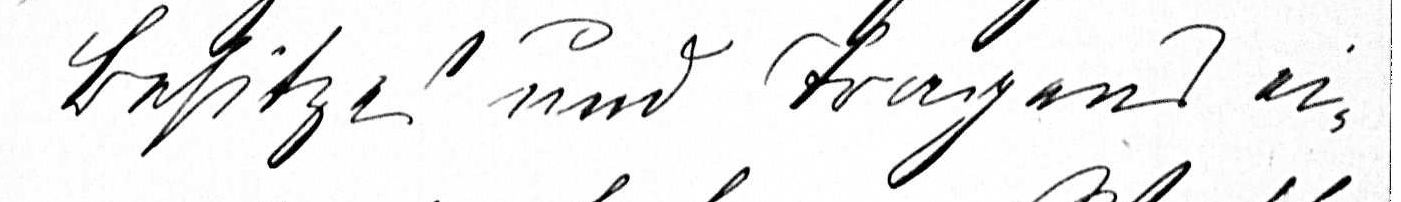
Besitzes und Fragens ei¬
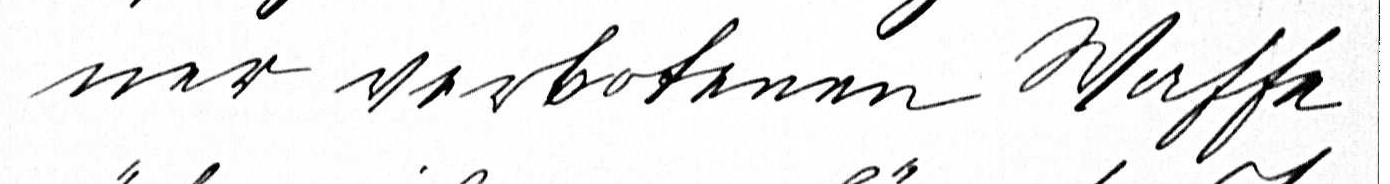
ner verbotenen Waffe
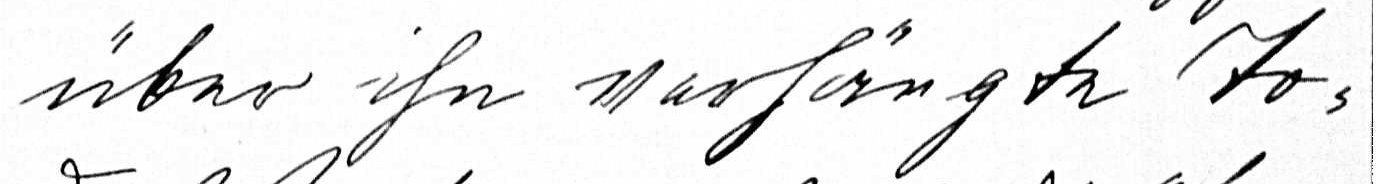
über ihn verhängte To¬
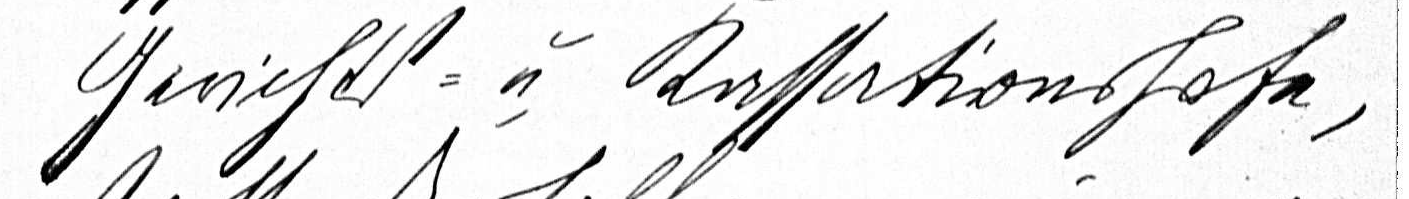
Gerichts- u. Cassationshofe,
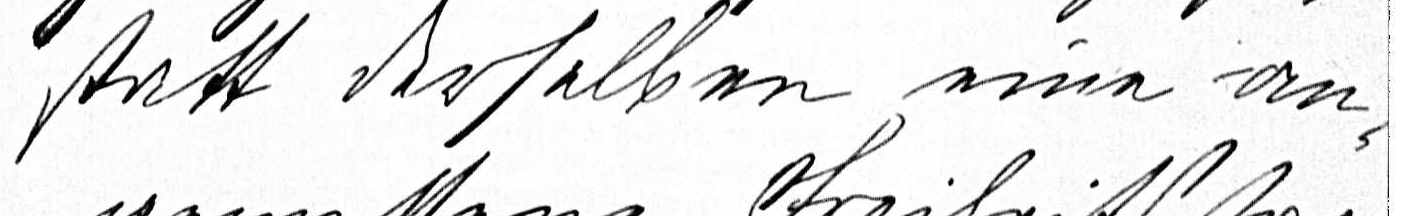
statt derselben, eine an¬
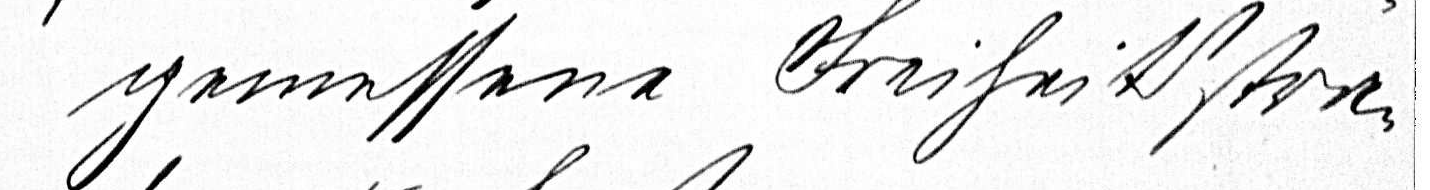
gemessen Freiheitsstra¬
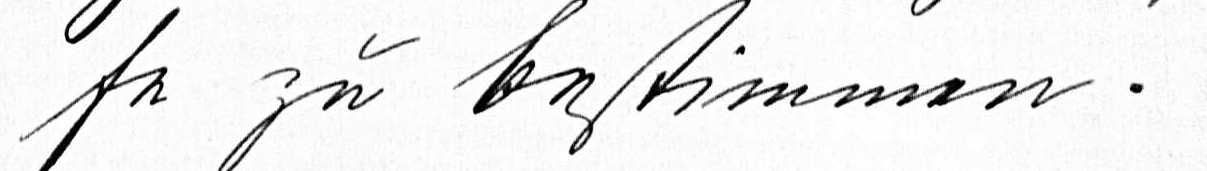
fe zu bestimmen.
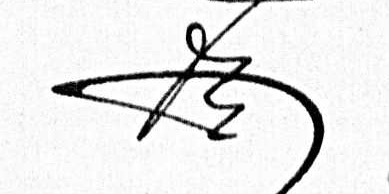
FJ
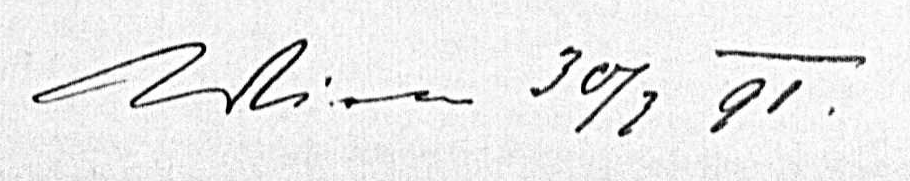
Wien, 30/3 1891
